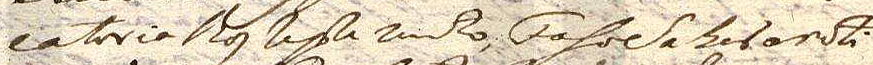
catoria lhos Reprezento, Faso Saber o noti
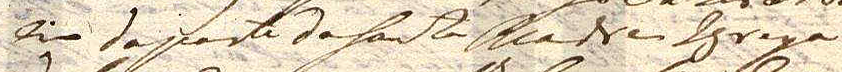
tio da parte da santa Madre Igreya
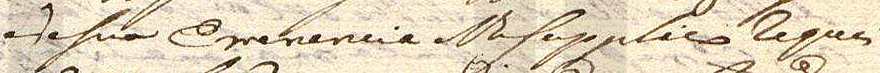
e de sua Emenencia e lhe supplico Requei
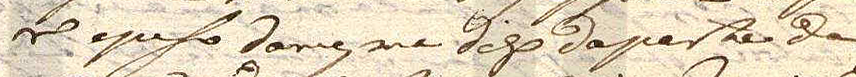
ro e pesso da mesma digo da parte da
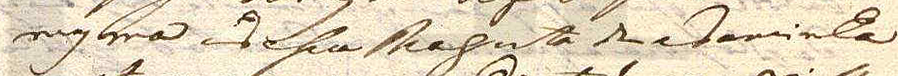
mesma e de sua Magestade e da minha
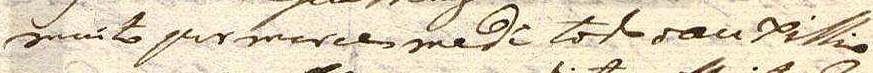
muito per merce me dê todo o auxillio
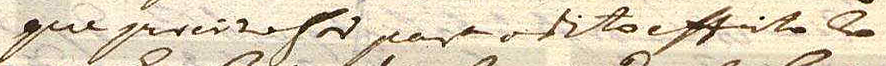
que precizo for para o dito effeito co
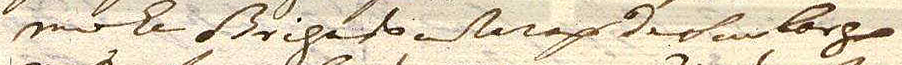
mo he obrigado a Razaõ de Seu Cargo
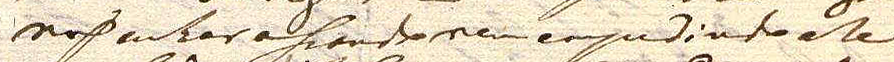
naõ enbarassando nem empedindo a Re
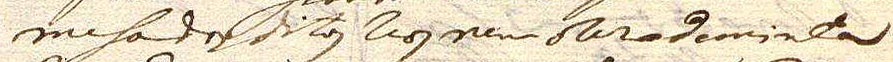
mesa dos ditos Reos nem o Vzo de minha
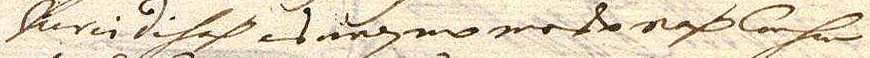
Iurisdisaõ e do mesmo modo naõ Consen
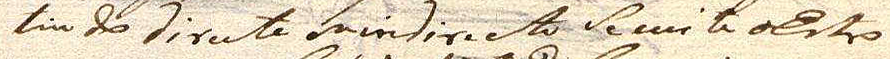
tindo directo ou indirecto Se euite o Estro
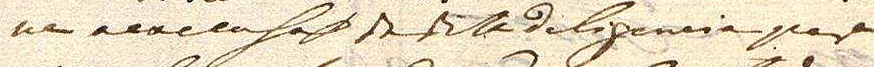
ua a execusaõ da dita deligencia para
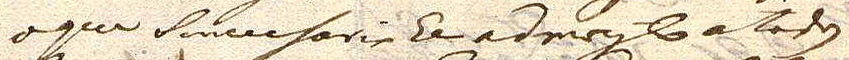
o que se necesario he admoesto a todos
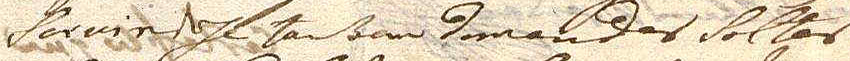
seruindose tambem de mandar soltar
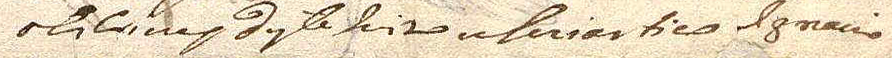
o EsCriuy deste Iuizo ecleziastico Ignacio
